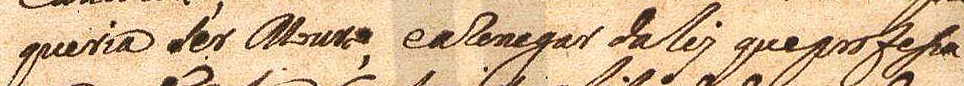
queria ser Mouro, e aRenegar da lej que professa
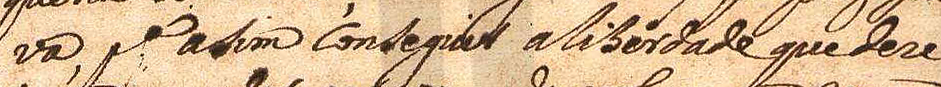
va p.a asim conseguir a liberdade que deze
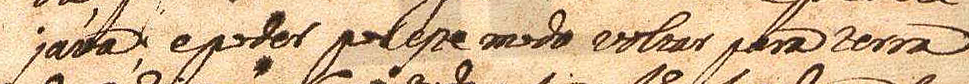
java, e poder por este modo voltar para terra
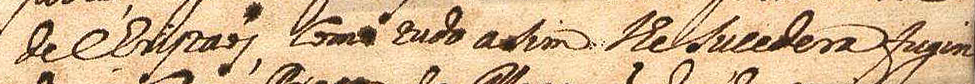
de christaõs, como tudo asim lhe sucedera fugin
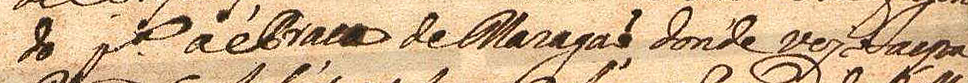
do p.a a Praça de Mazagaõ donde vejo a esta
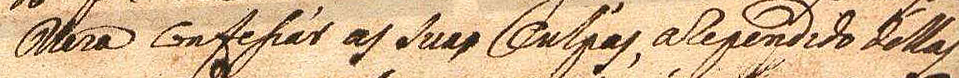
Meza confessar as suas Culpas, aRependido dellas
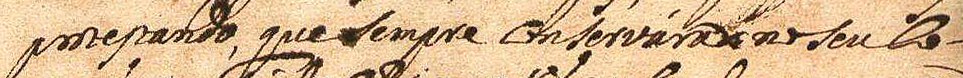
protestando, que sempre conservára no seu Co
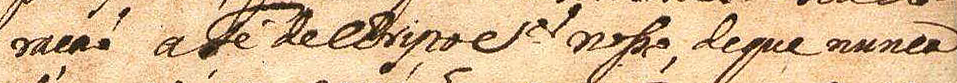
ração a Fé de Christo S.or nosso, de que nunca
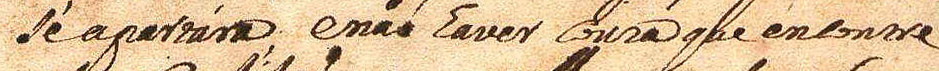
se apartára, e naõ haver couza que encontre
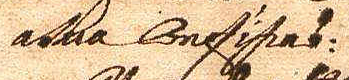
a sua confissaõ:
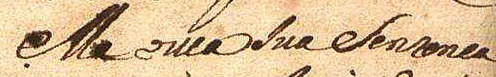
elle ouça sua Sentença
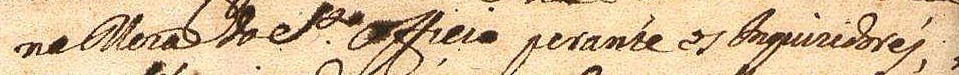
na Meza do S.to Officio perante os Inquizidores,
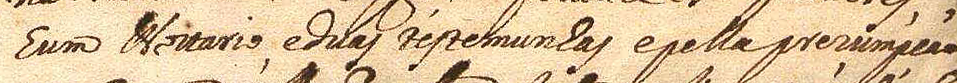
hum Nottario, e duas testemunhas e pella prezumpçaõ
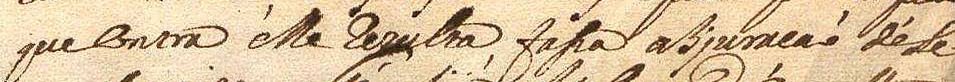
que contra elle Rezulta, fassa abjuraçaõ de Le
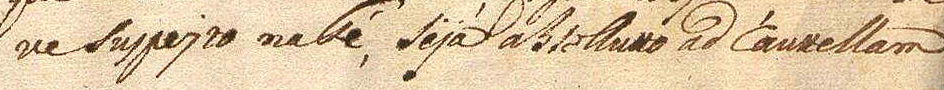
ue suspejto na Fé, seja absollutto ad Cautellam
